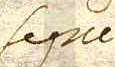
segue.
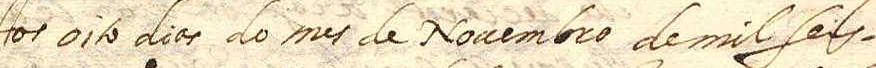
Aos oito dias do mes de Nouembro de mil Seis̄
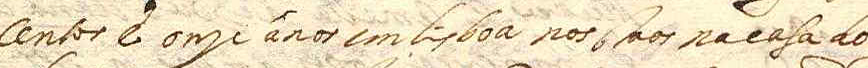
centos & onze ānos em lisboa nos estaos na casa do
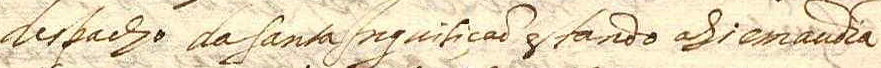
despacho da Santa Jnquisiçaõ estando ahi em audiā
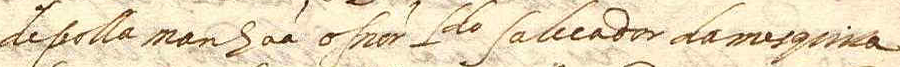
de polla manhaã o Snor̄ Ldo Saluador da mesquita
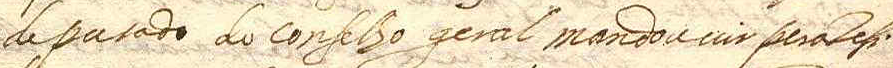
deputado do conSelho geral mandou uir perāte si
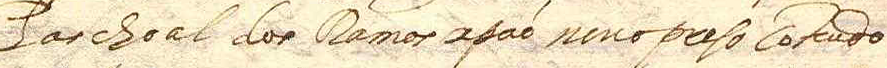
Paschoal dos Ramos xpaõ nouo preso cõteudo
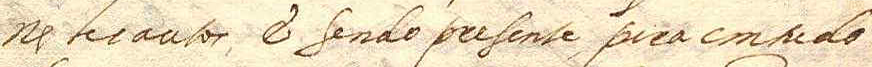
nestes autos, & Sendo presente, pera em tudo
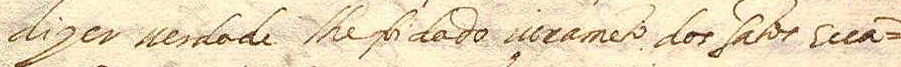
dizer uerdade lhe foi dado iuramẽto dos Sãtos Euã
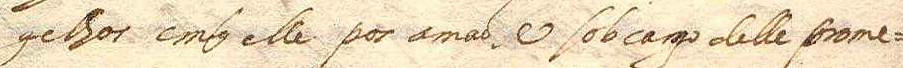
gelhos em q̄ elle pos a maõ e sob cargo delle prome
